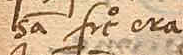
sā frco era
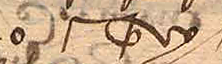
o sp̄vy
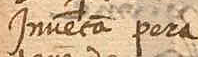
Jnuēcā pera
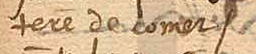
terē de comer
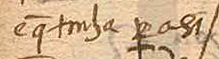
e q̄ tinha ꝑa si
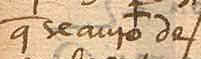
q̄ se aujō de
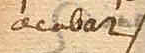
acabar
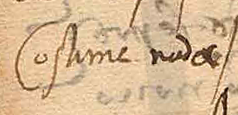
Costume nada
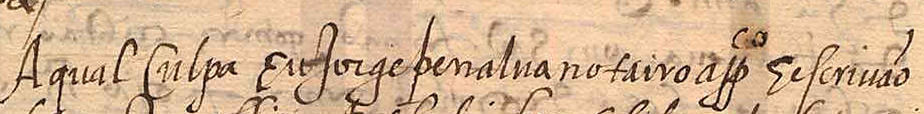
A qual Culpa Eu Jorge penalua notairo appco E escriuão
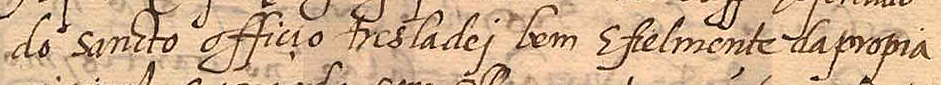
do sancto officio tresladej bem E fielmente da propia
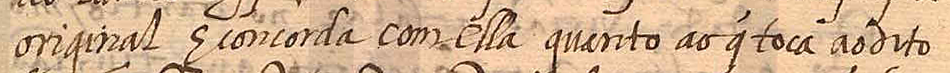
original E concorda com ella quanto ao q̄ toca ao dito
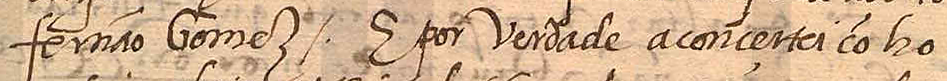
fernão Gomez /. E por verdade a concertei cō ho
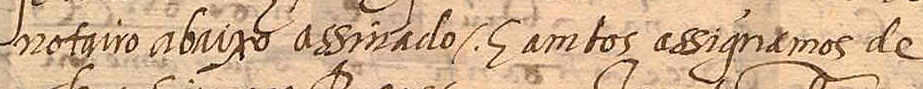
notairo a baixo assinado /. E ambos assignamos de
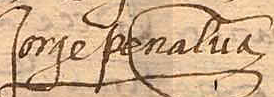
Jorge Penalua
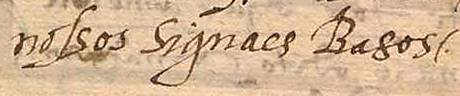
nossos Signaes Rasos /.
